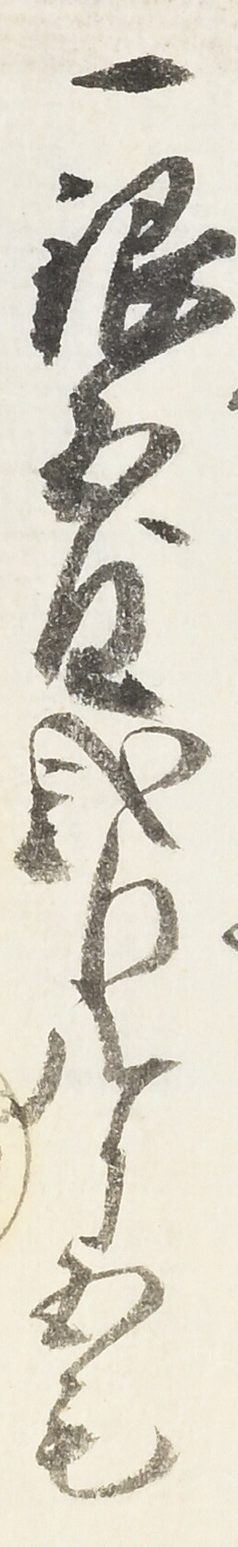一銀五匁弐分八厘五毛
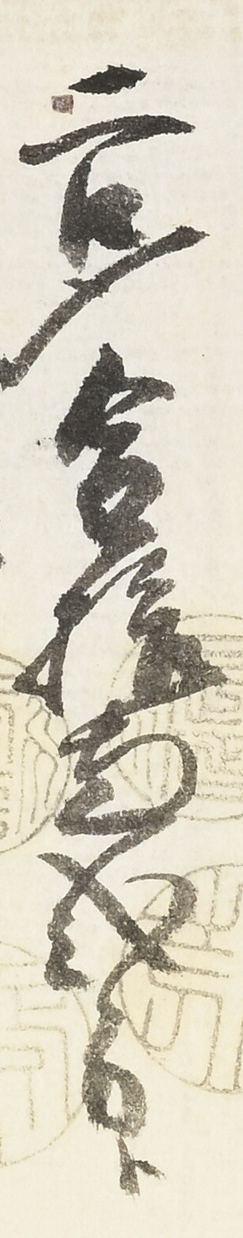二口〆金拾両弐分ト
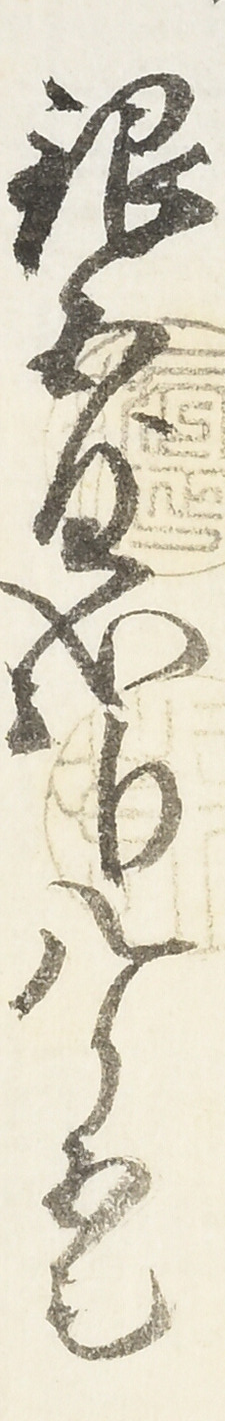銀五匁弐分八厘五毛
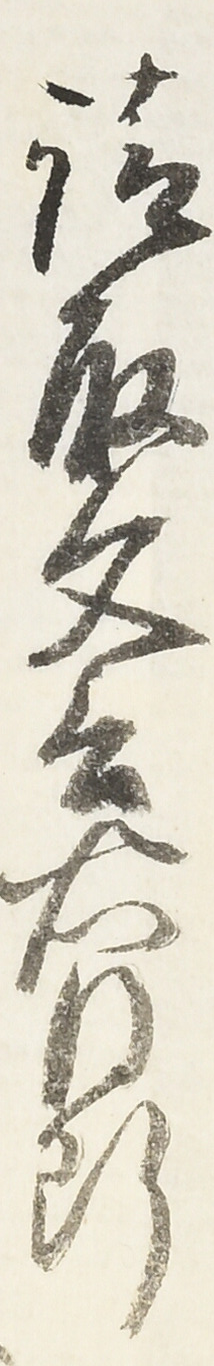請取文言右同断
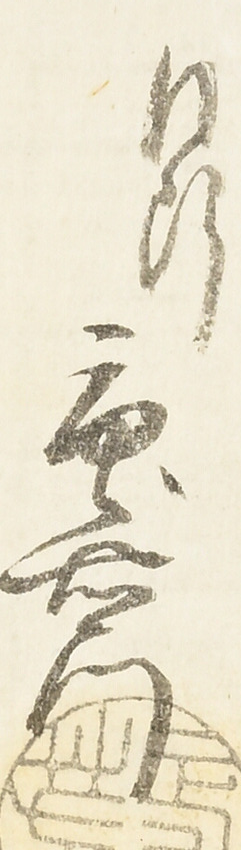市郎右衛門
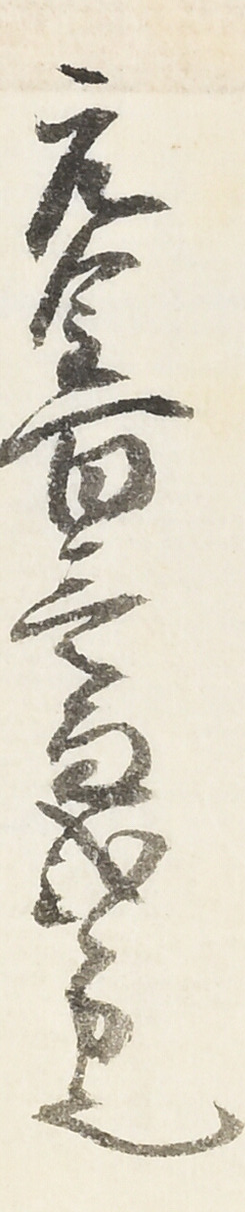元金百壱両弐分也
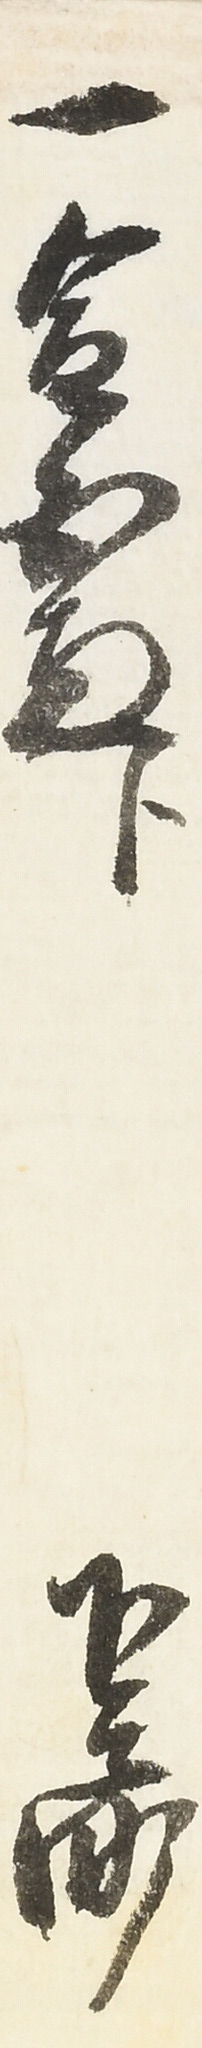一金五両ト下モ町
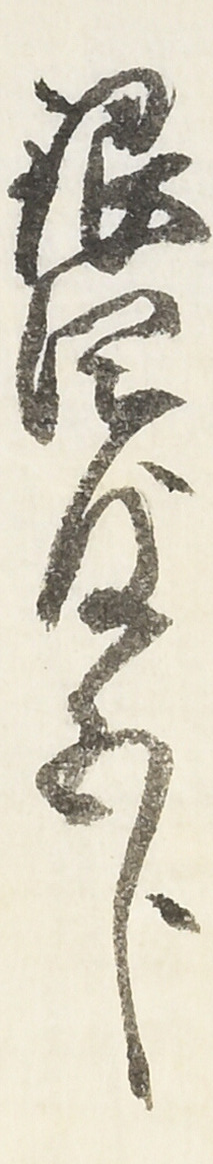銀四匁五分
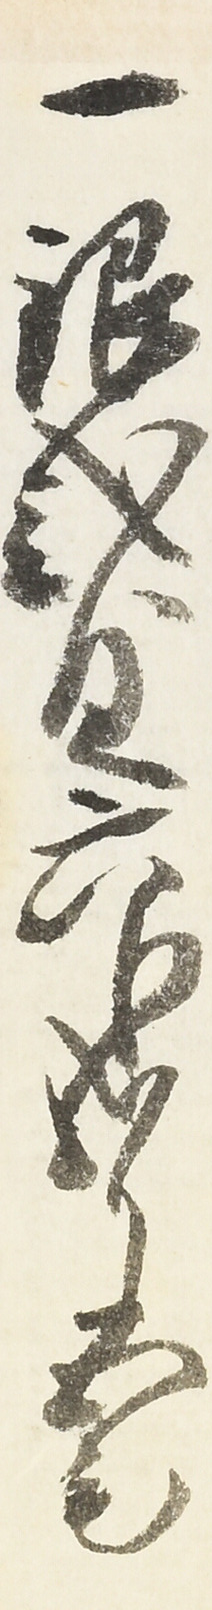一銀弐匁六分弐厘五毛
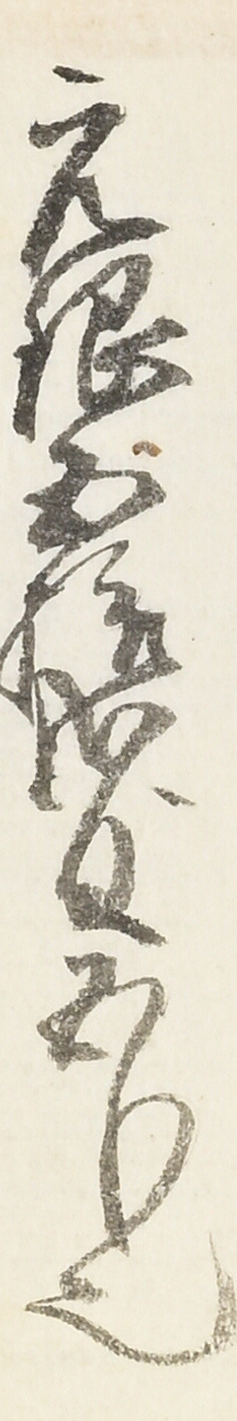元銀五拾弐匁五分也
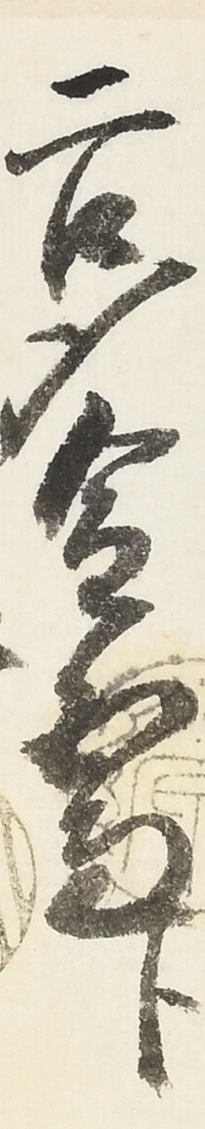二口〆金五両ト
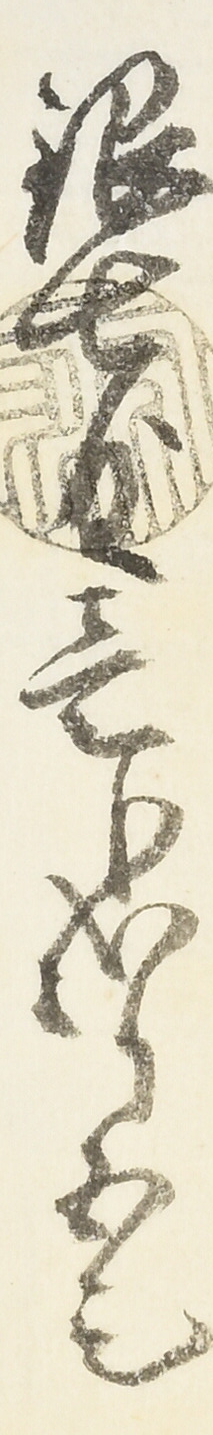銀七匁壱分弐厘五毛
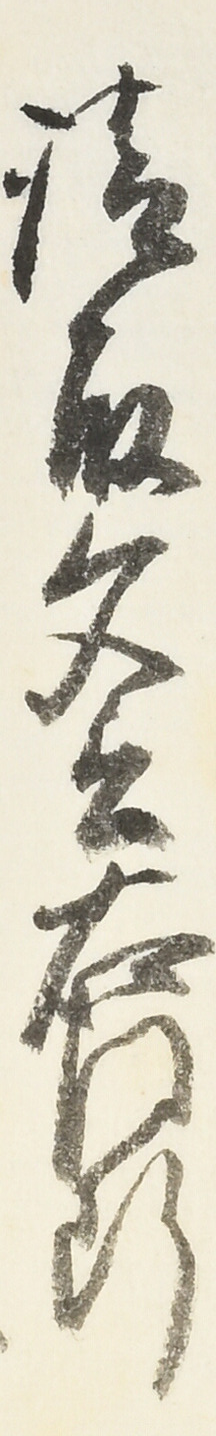請取文言右同断
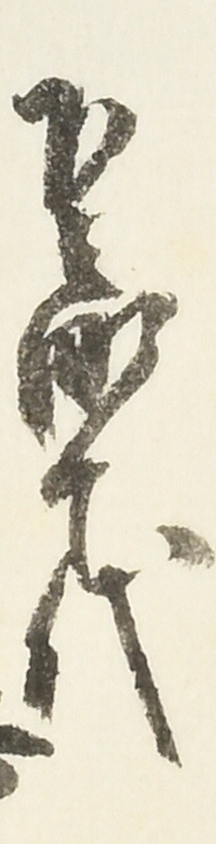下モ町丁代
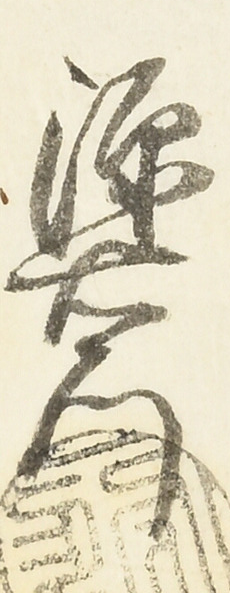源右衛門

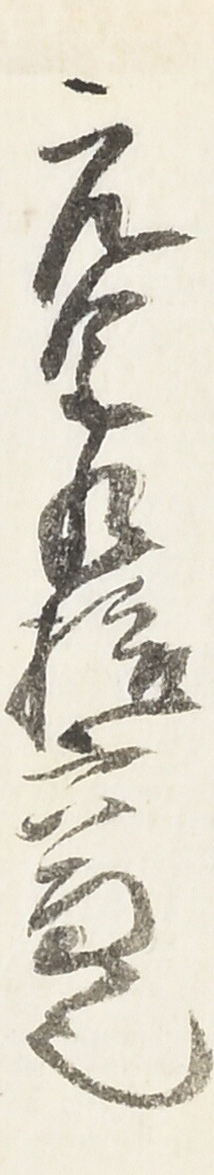元金九拾六両也
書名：御才覚金御利足割渡扣帳
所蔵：伊那市立高遠町図書館・合同会社AMANE
